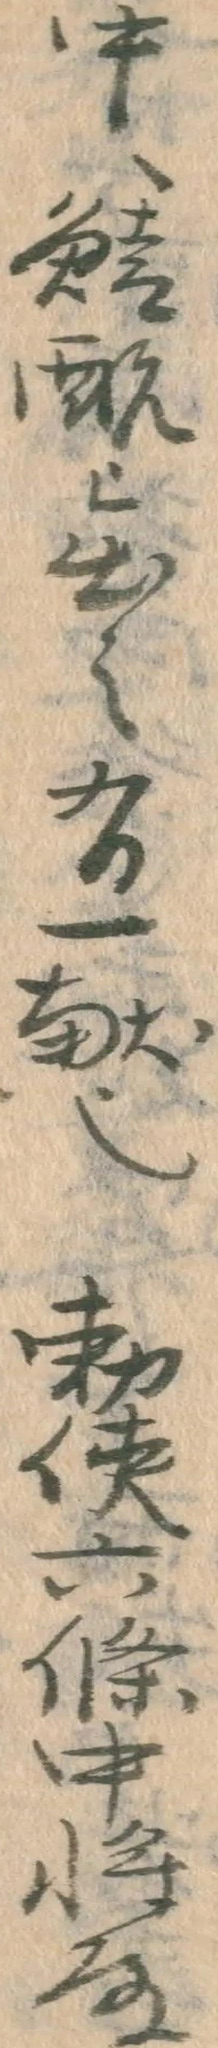中へ鯖酢被出之旨一献也、勅使六條中将殿
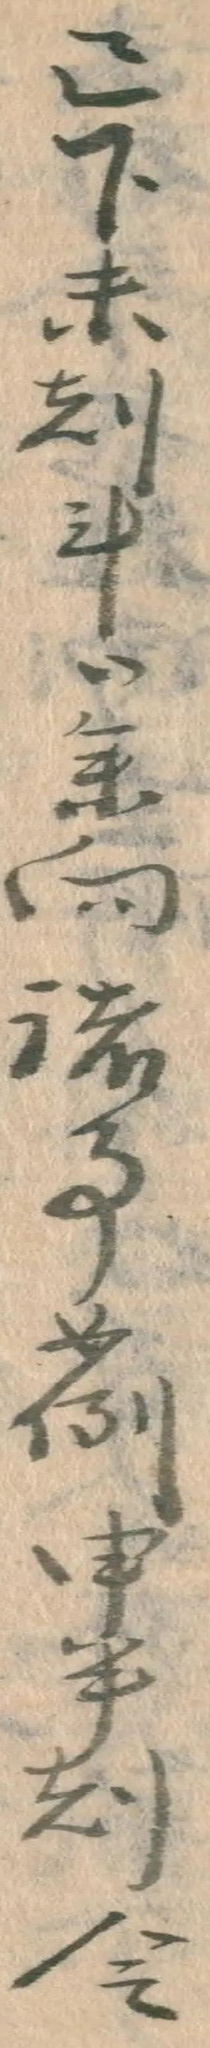已下、未刻計御参向、諸事如例申半刻令
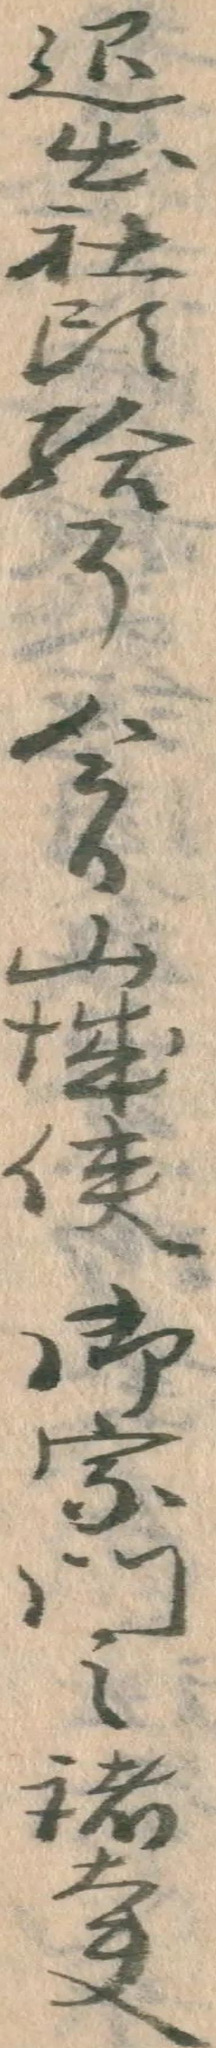退出社頭給了、今日山城使御家門之諸大夫
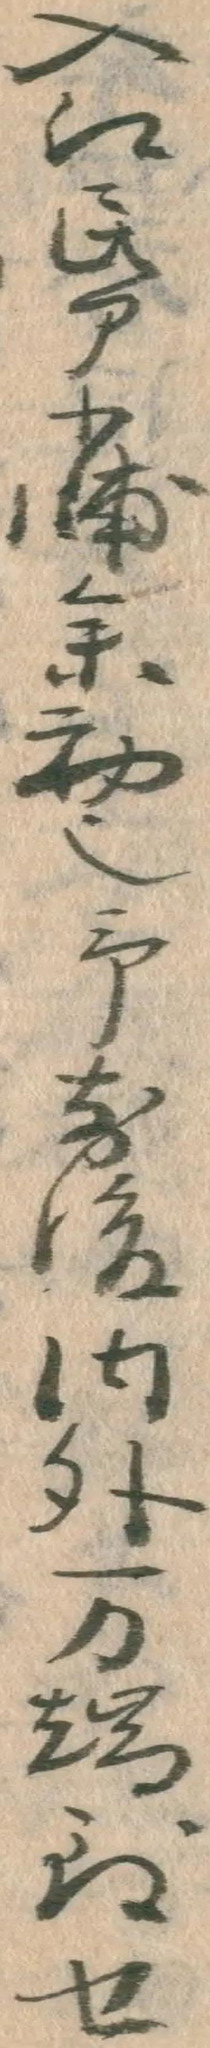入江民部小輔参勤也、予前後内外万端致世
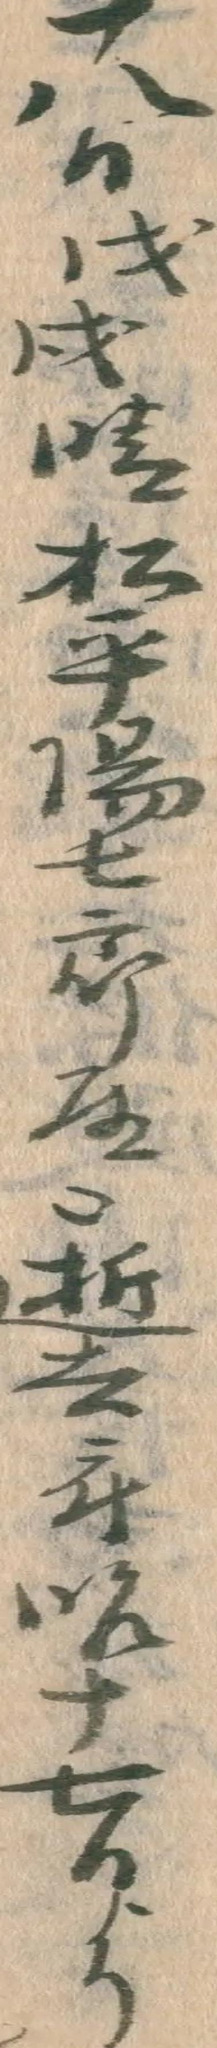十八日戊戌晴、松平陽七郎殿御逝去ニ付、昨十七日より
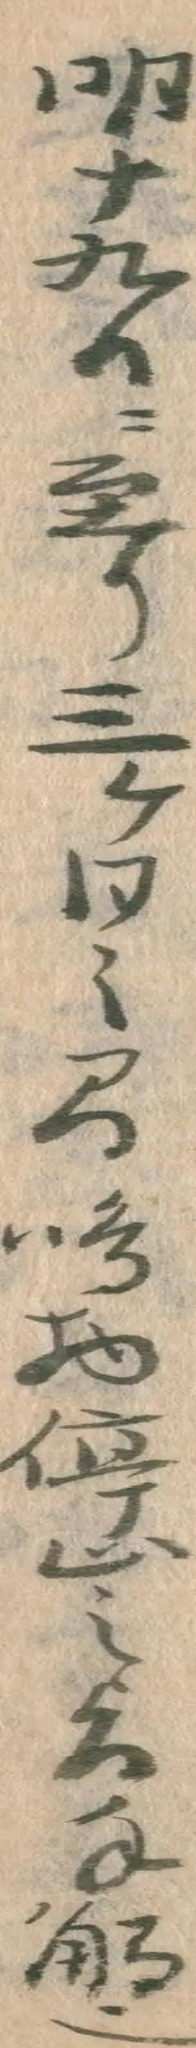明十九日ニ至り三ケ日之間鳴物停止之旨手触也、
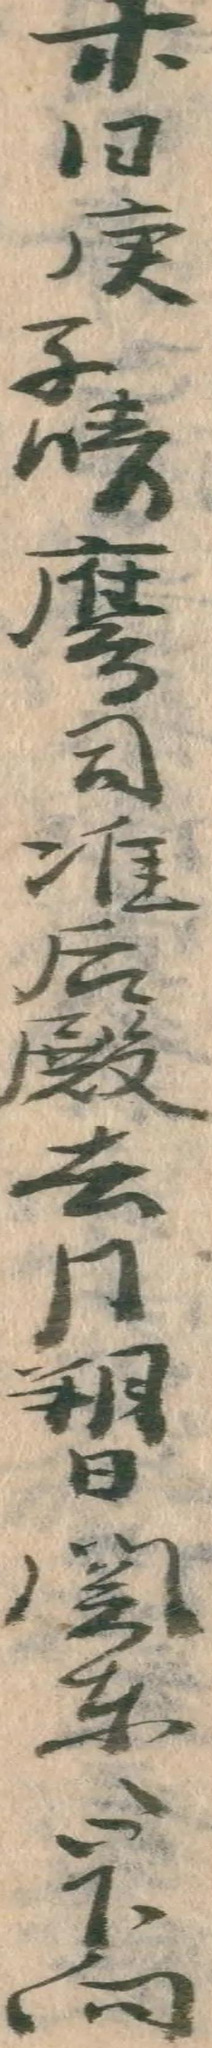廿日庚子晴、鷹司准后殿、去月朔日関東へ御下向
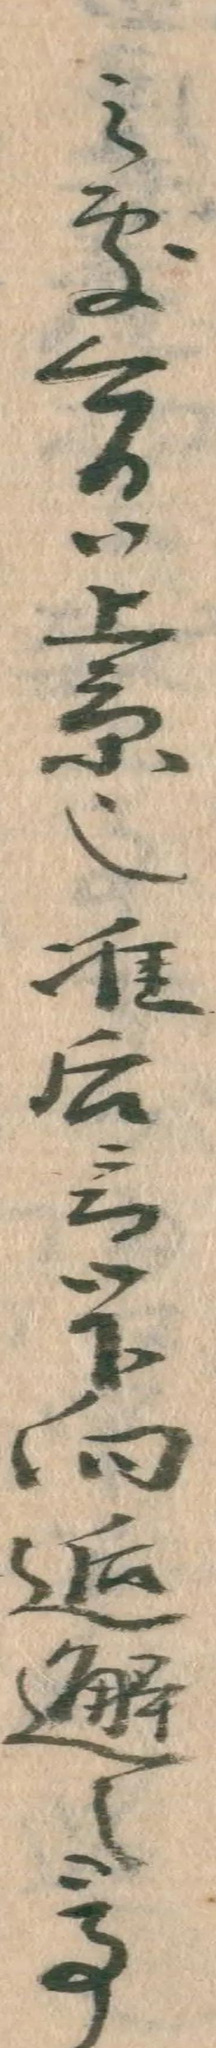之處、今日御上京也、准后ニ而御下向邂逅之御事
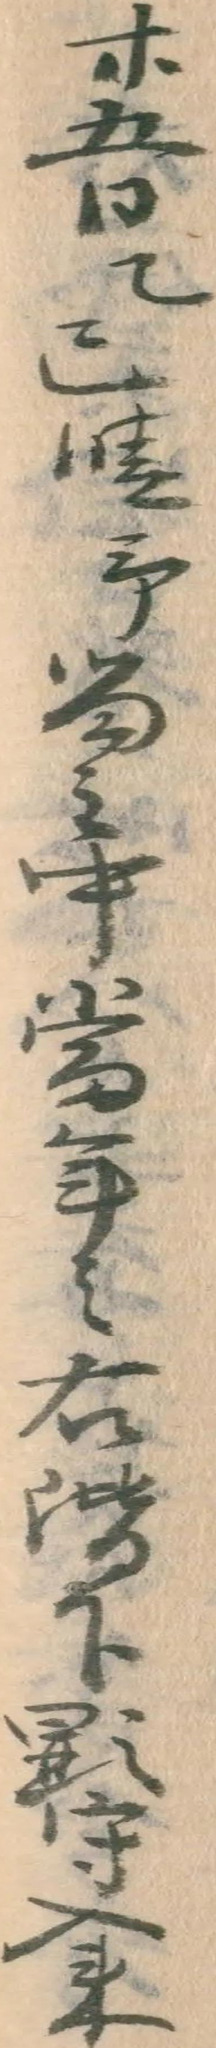廿五日乙巳晴、予留守中當年之右階下顕守入来、
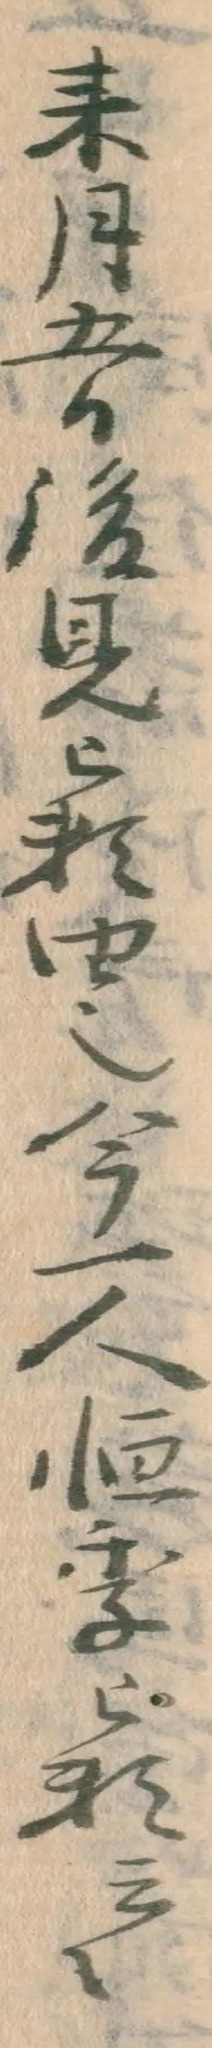来月五日後見被頼由也、今一人恒季被頼云々、
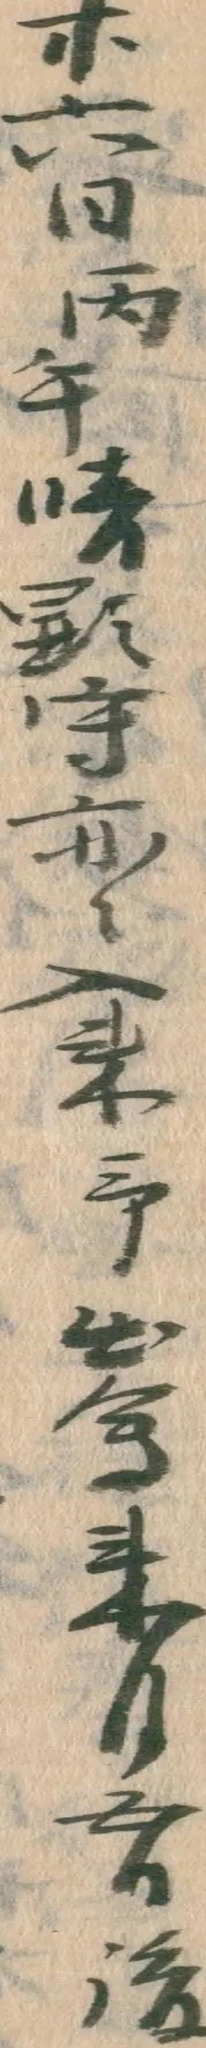廿六日丙午晴、顕守亦々入来、予出會、来月五日後
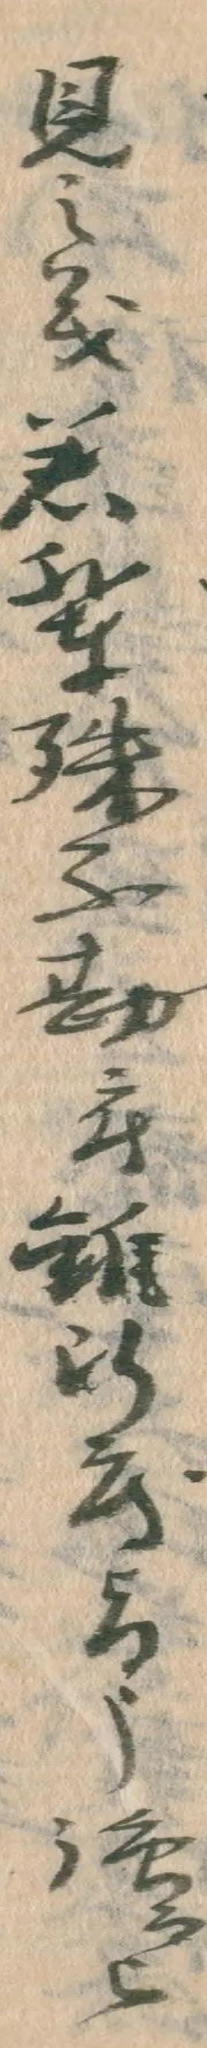見之義、若輩殊不勘ニ付雖断度旨申談而、被
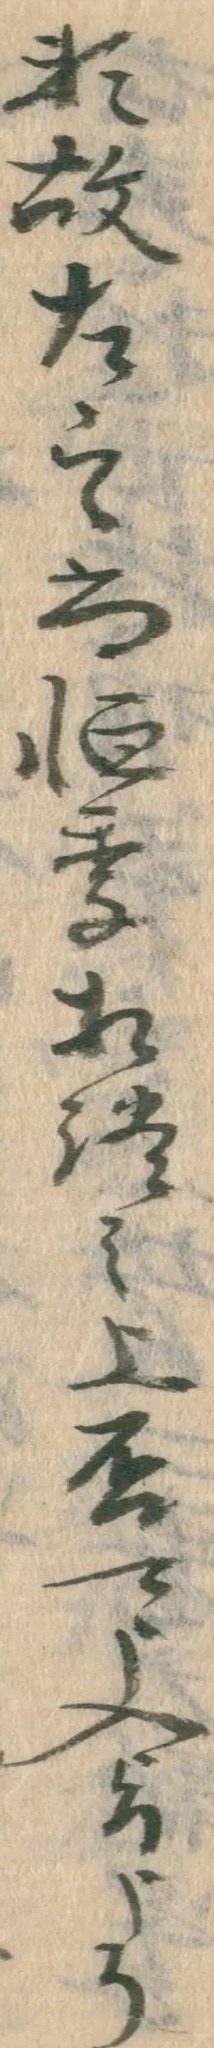頼故左被候、尚恒季相談之上否可申入旨申了、
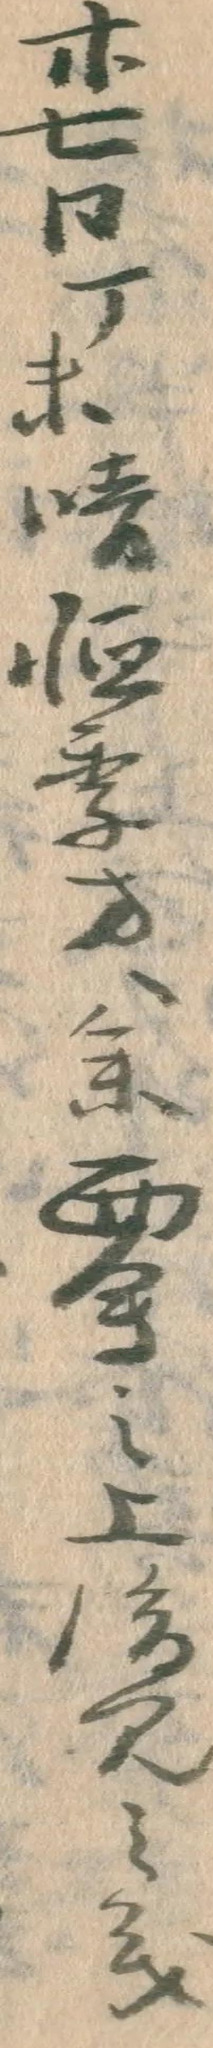廿七日丁未晴、恒季方へ参、面會之上、後見之義
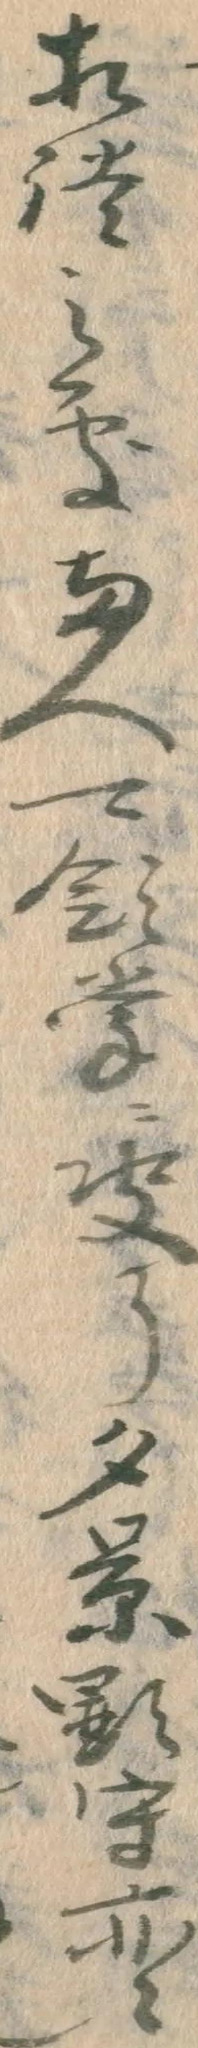相談之處、両人可領掌ニ決了、夕景顕守亦々
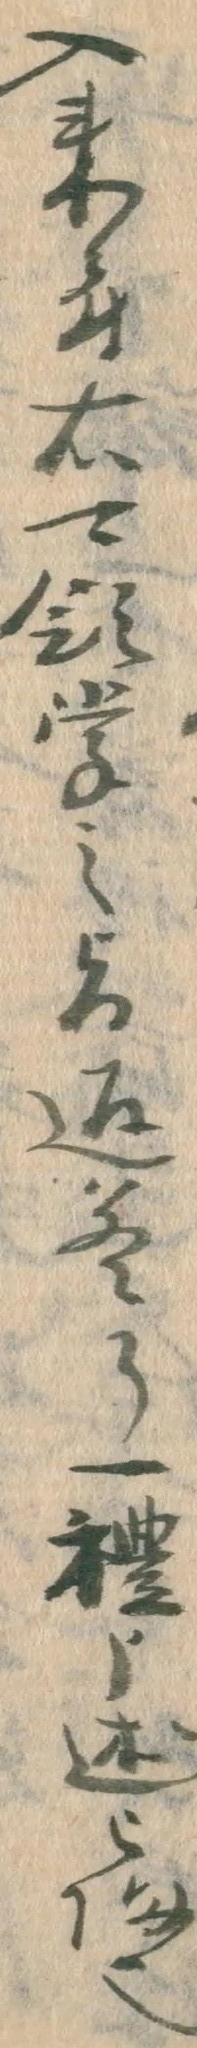入来ニ付、右可領掌之旨返答了、一禮申述被侍也、
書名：賀茂社記録. 第63冊
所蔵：国立国会図書館 National Diet Library, JAPAN
